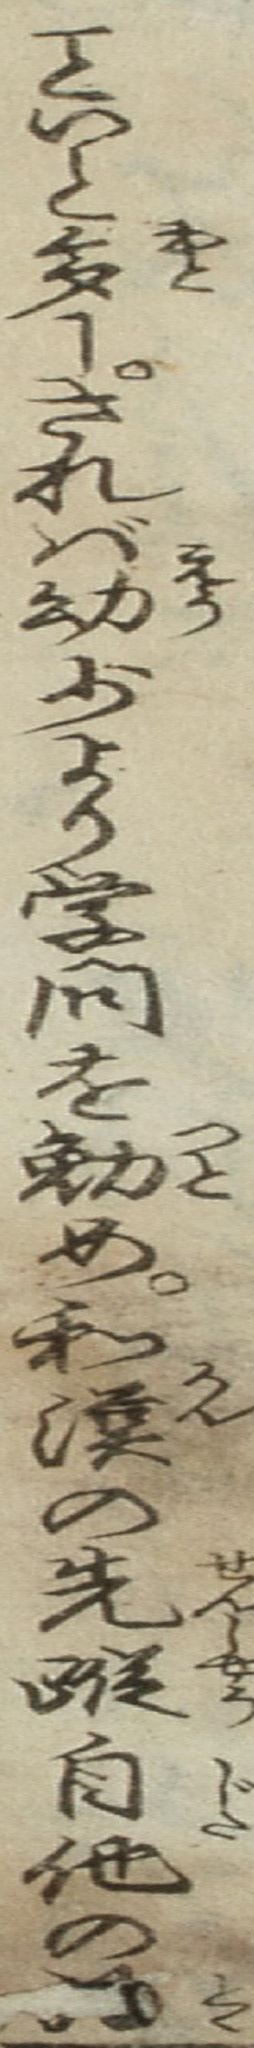こといと多し。されば幼少より学問を勉め。和漢の先蹤自他の得
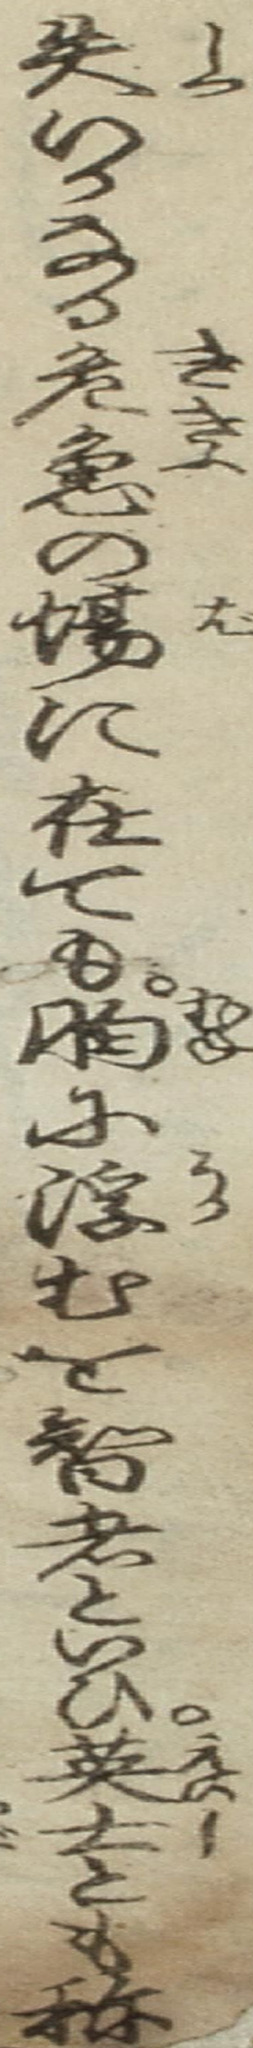失いかなる危急の場に在ても。胸に浮むを智者といひ。英士とも称
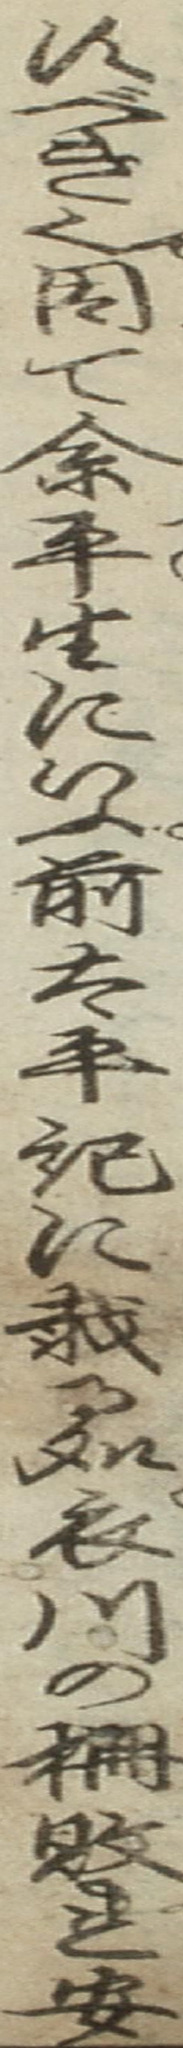すべき也。因て余平生にいふ。前太平記に載る処。衣川の柵敗れ安
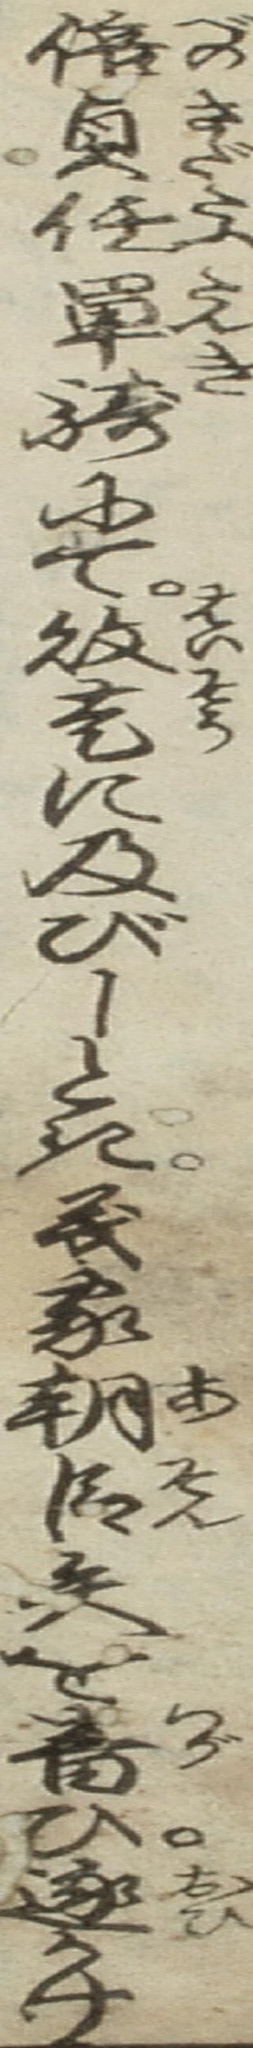倍貞任単騎にて。敗走に及びしとき。義家朝臣矢を番ひ。逐かけ
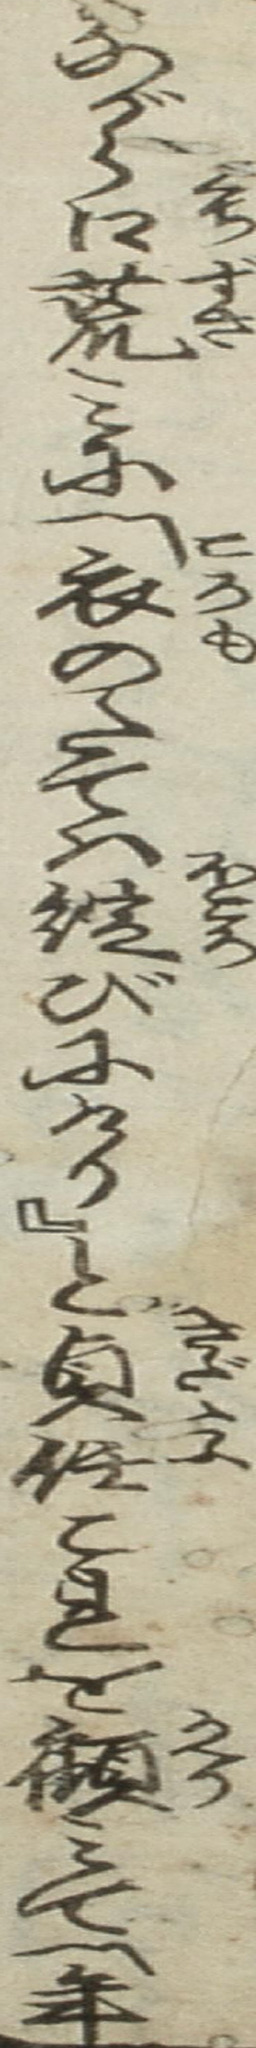ながら口荒みに〽衣のたては綻びけり』と貞任これを顧みて「年
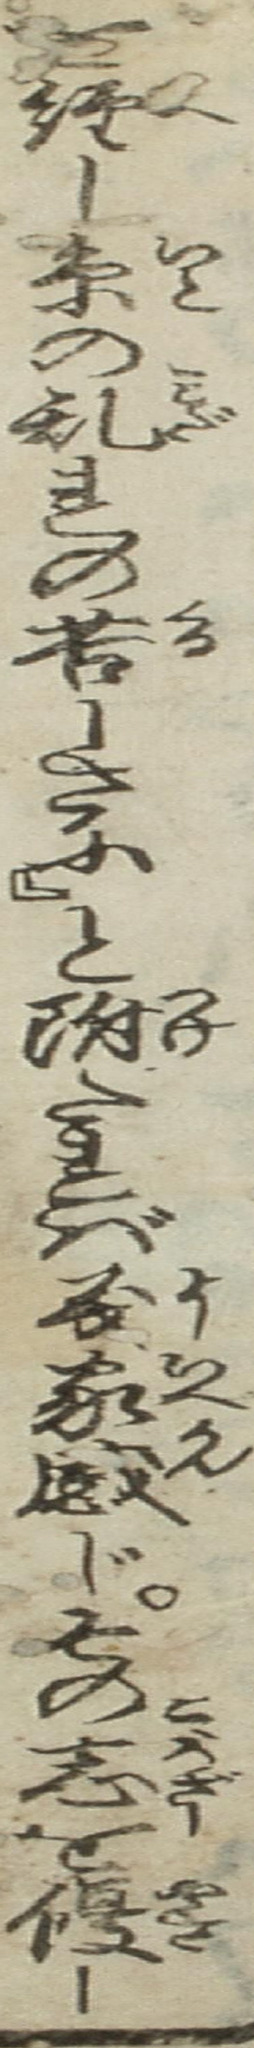を経し糸の乱れの苦しさに』と附たれば義家感じ。その志を優し
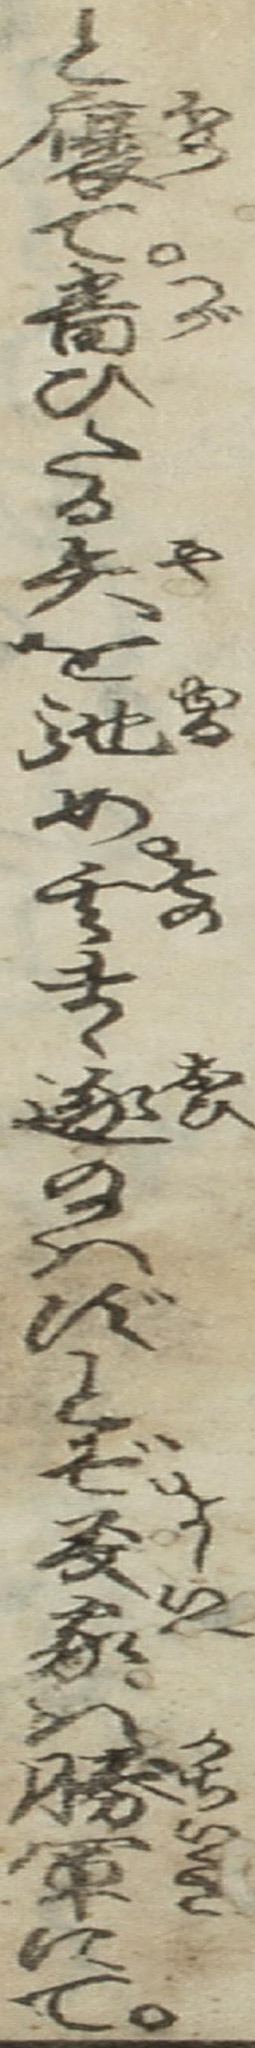と褒て。番ひたる矢を弛め。其まゝ逐給はずとぞ。義家は勝軍にて。
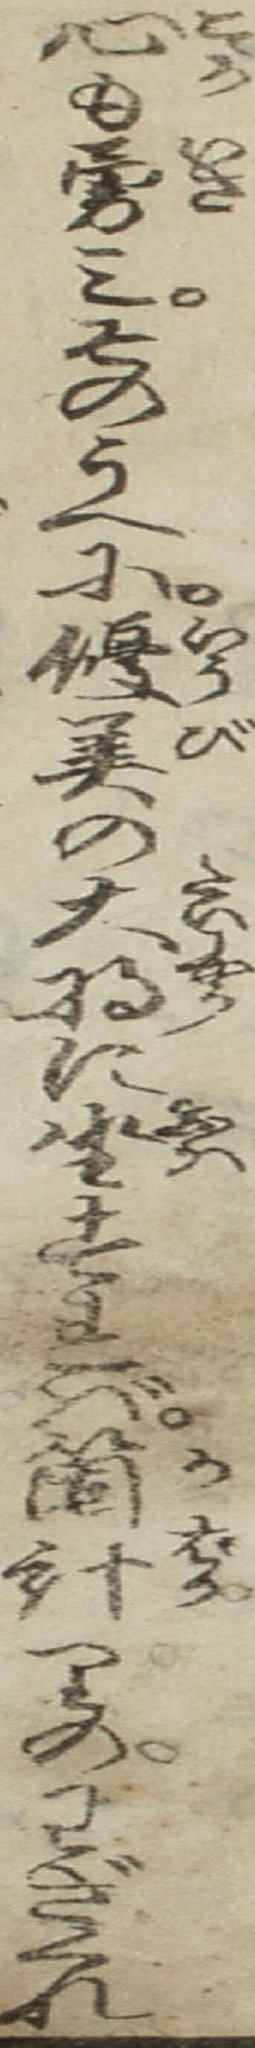心も勇み。そのうえに。優美の大将に坐すれば。箇計りの。わざくれ
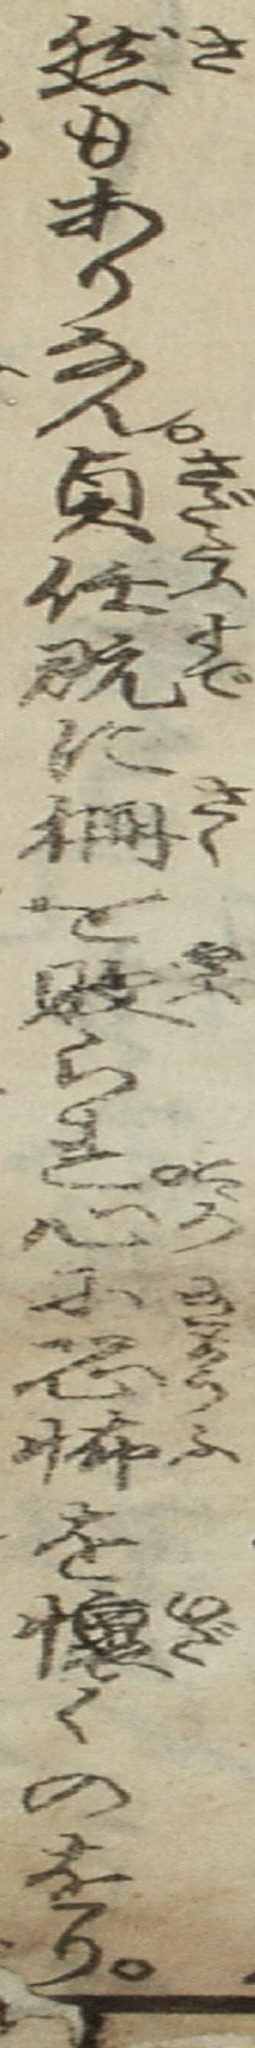然もありなん。貞任既に柵を敗られ。心に恐怖を懐くのをり。
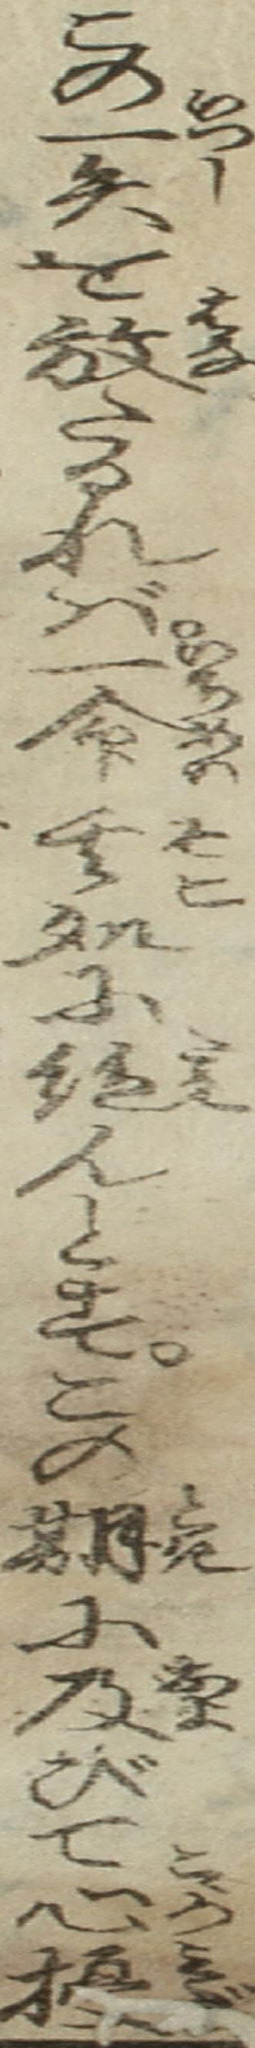この一矢を放さるれば。一命其処に絶んとす。この期に及びて心櫌
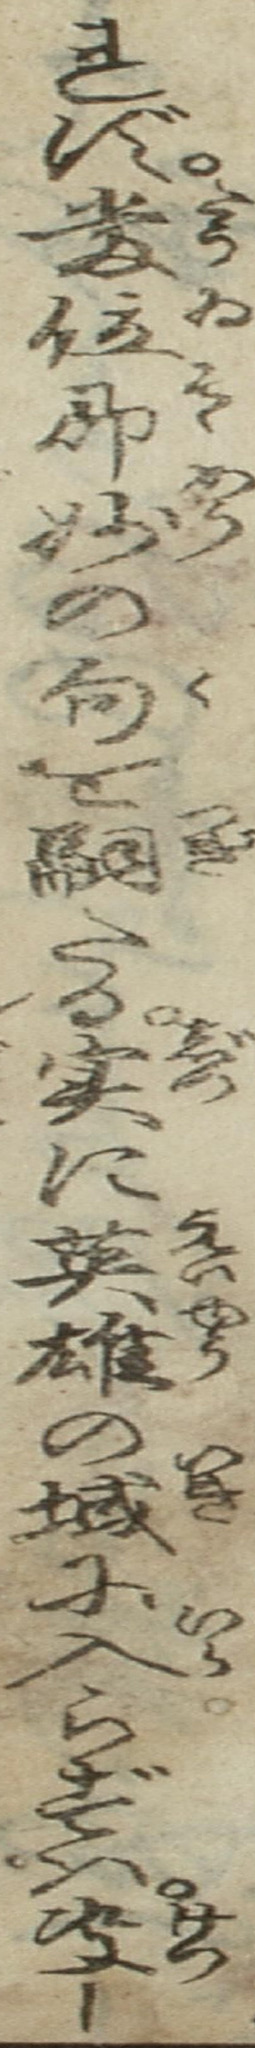れず。当位即妙の句を嗣たる。実に英雄の域に入らずは。決し
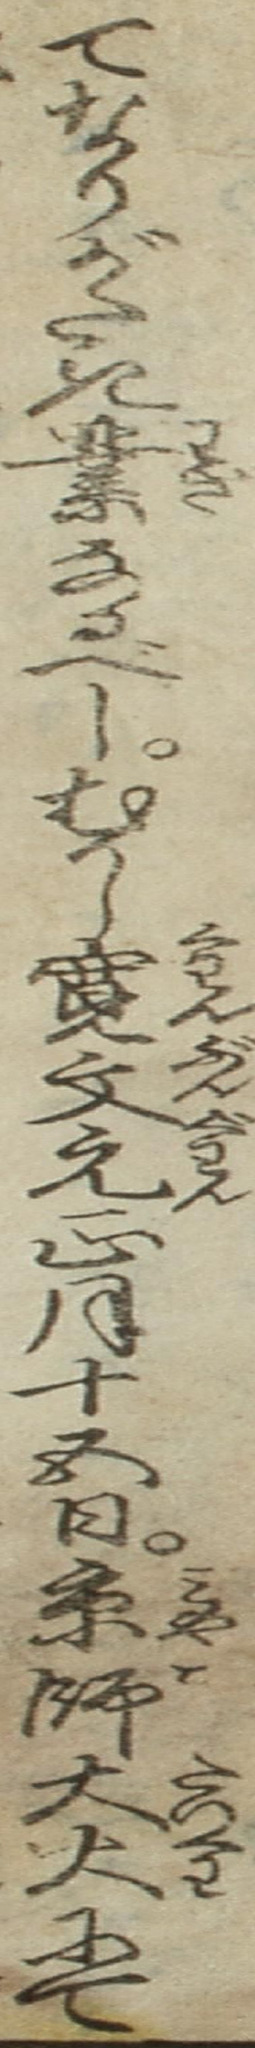てなりがたき業なるべし。むかし寛文元正月十五日。京師大火にて
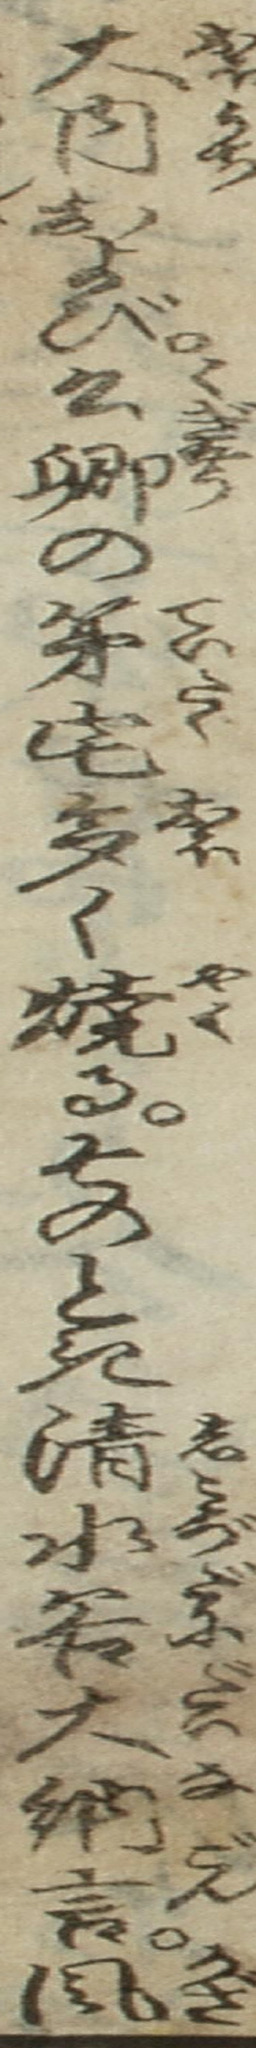大内および。公卿の弟宅多く焼る。そのとき清水谷大納言。風
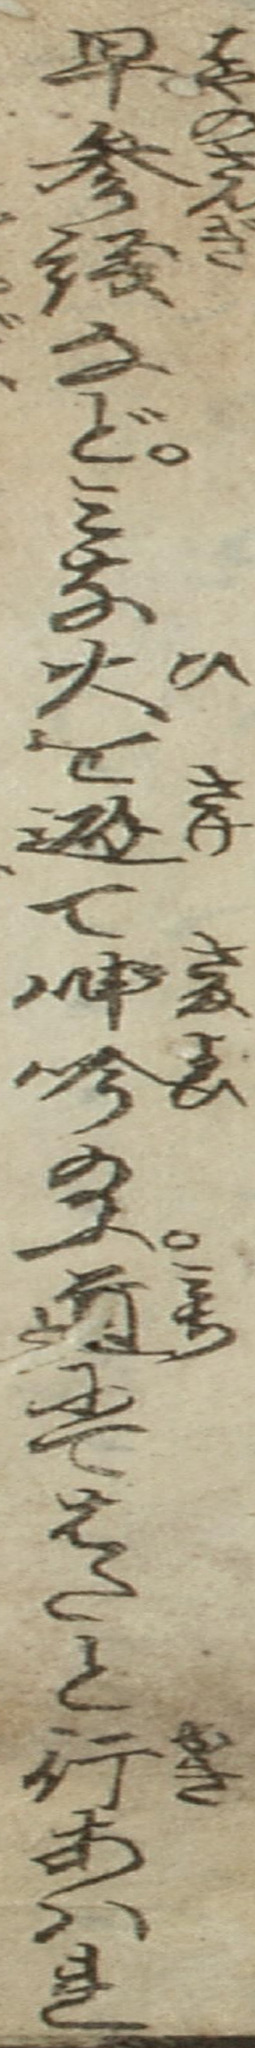早参議など。みな火を避て呻吟給ふ。道にてはたと行あはれ
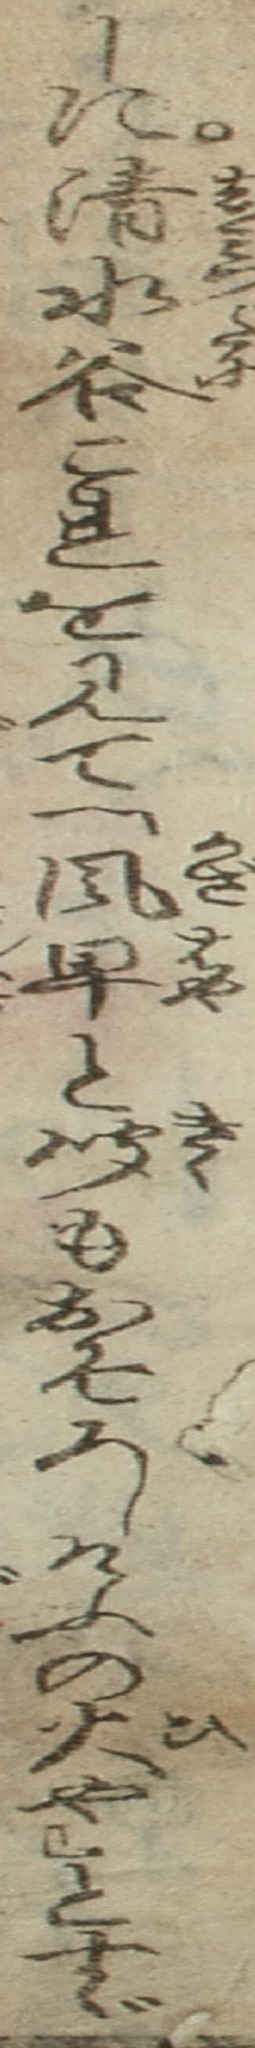しに。清水谷これを見て〽風早と聞もおそろしけふの火や』とすゞ
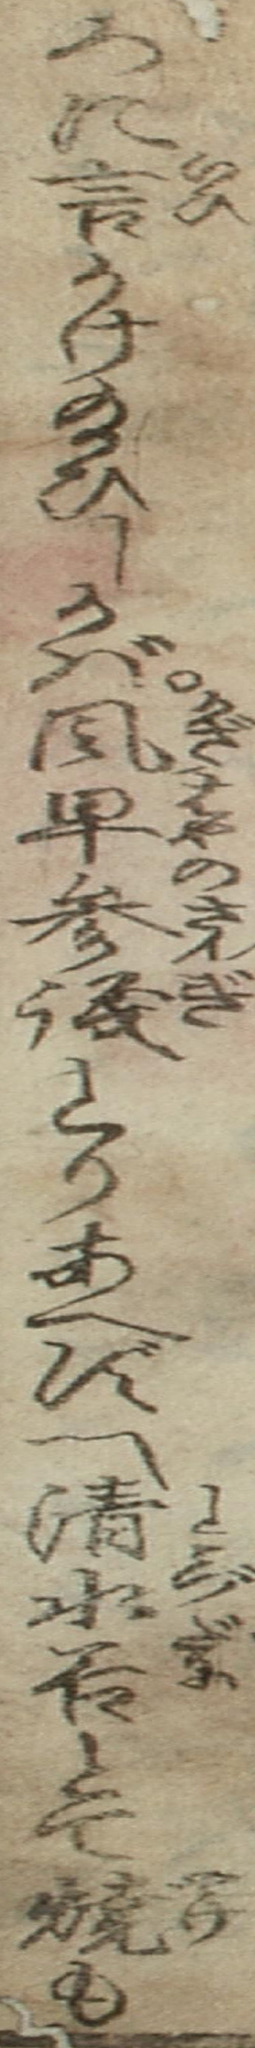ろに言かけ給ひしかば。風早参議とりあへず〽清水谷とて焼も
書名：安政見聞録　中
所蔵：東京大学地震研究所図書室 Earthquake Research Institute Library, The University of Tokyo, JAPAN
